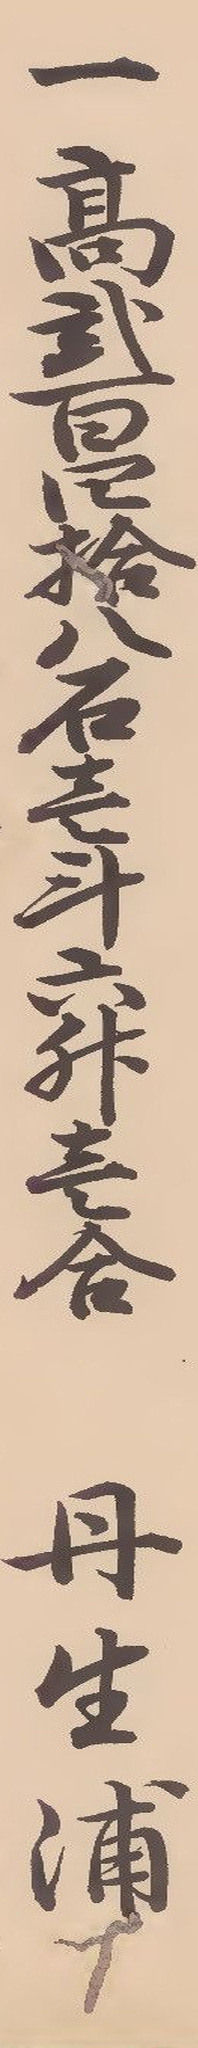一高弐百四拾八石壱斗六升壱合丹生浦

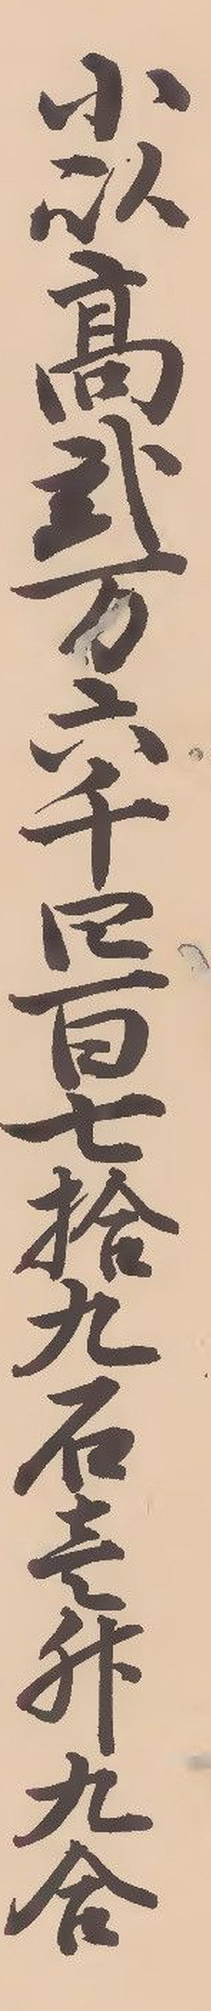小以高弐万六千四百七拾九石壱升九合
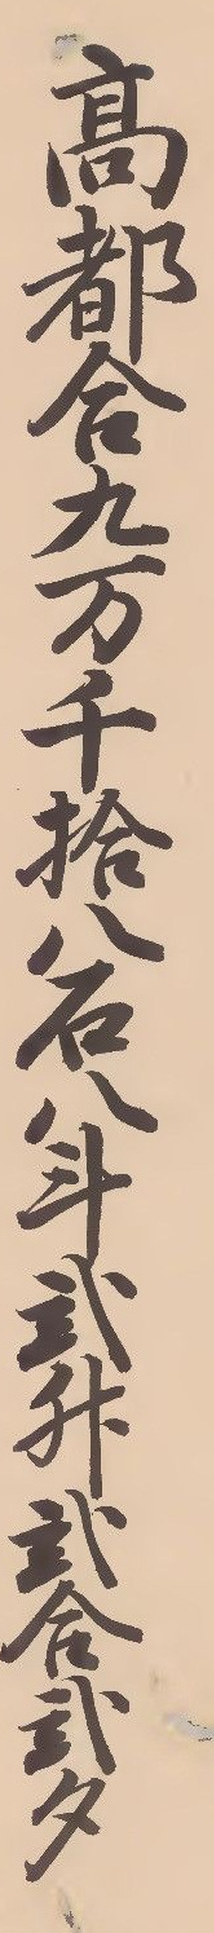高都合九万千拾八石八斗弐升弐合弐勺
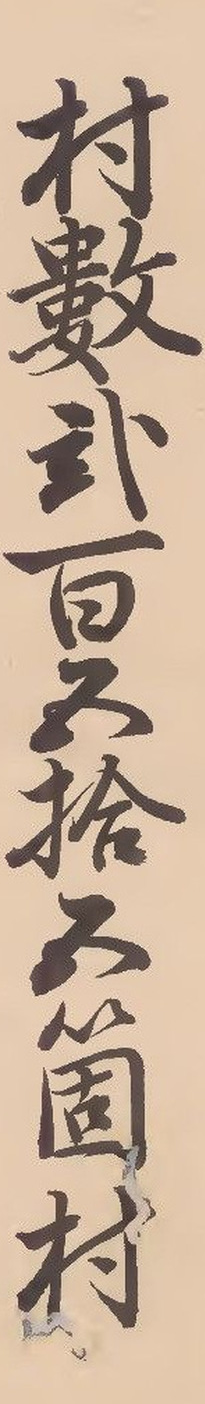村数弐百五拾五箇村
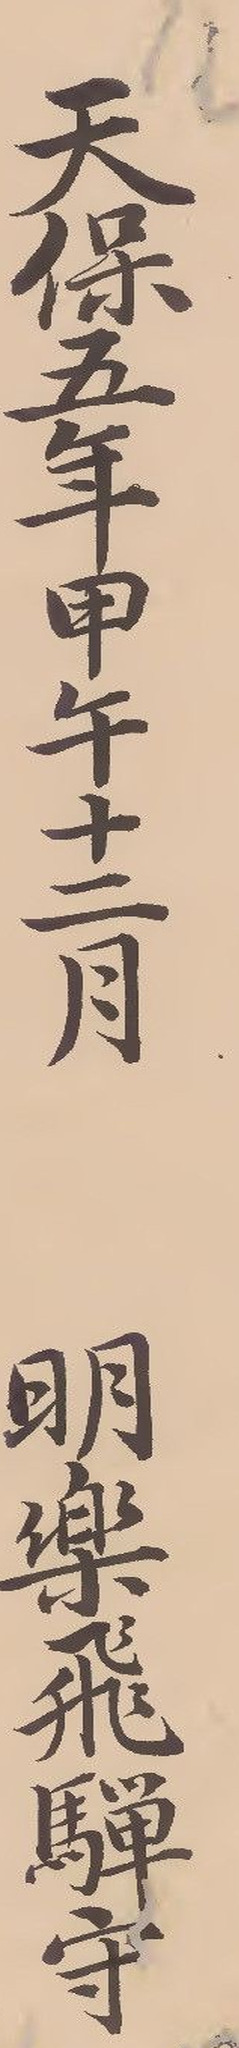天保五年甲午十二月明楽飛騨守
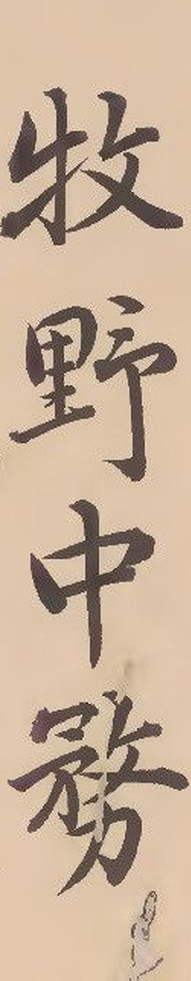牧野中務
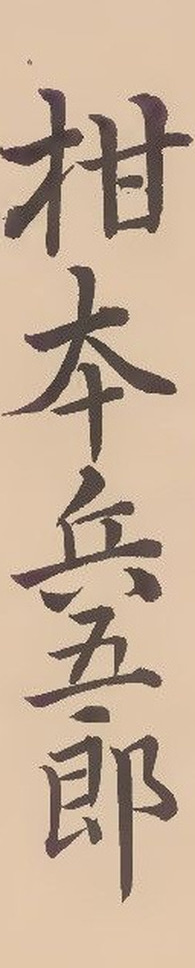柑本兵五郎
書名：若狭国郷帳
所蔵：国立公文書館 National Archives of Japan
